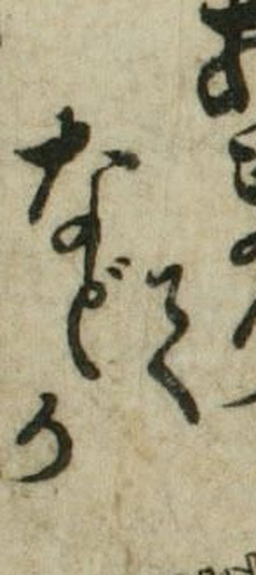などか
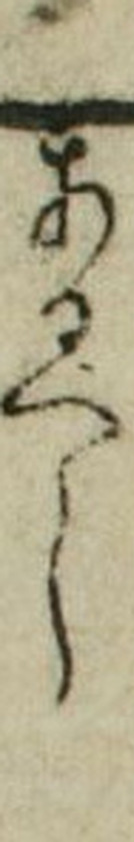あるべし
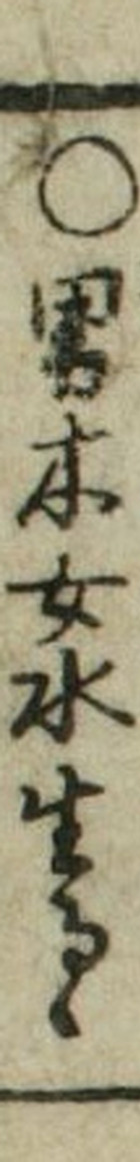○男木女水生るゝ
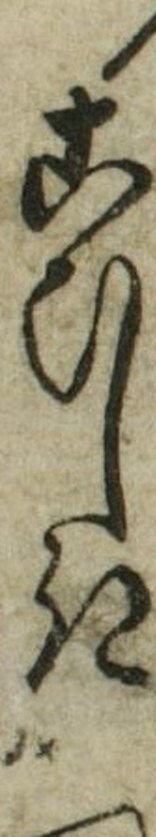こひしき

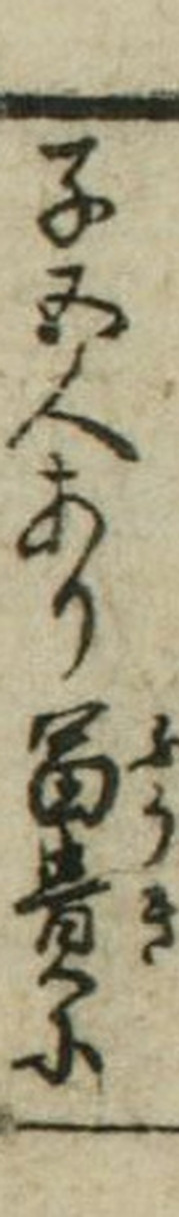子五人あり富貴に
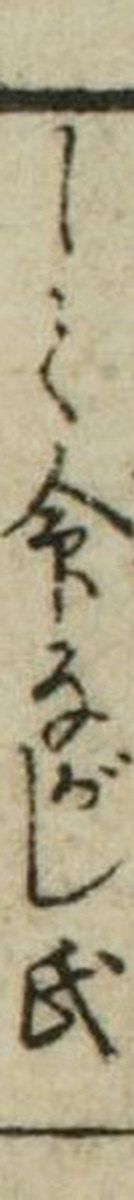して命ながし氏
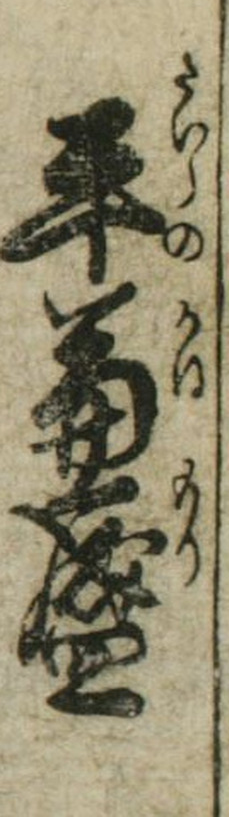平兼盛
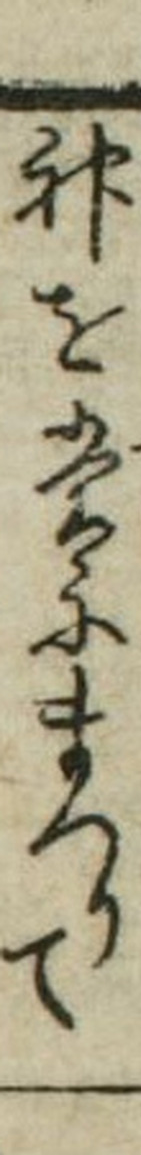神を常にまつりて
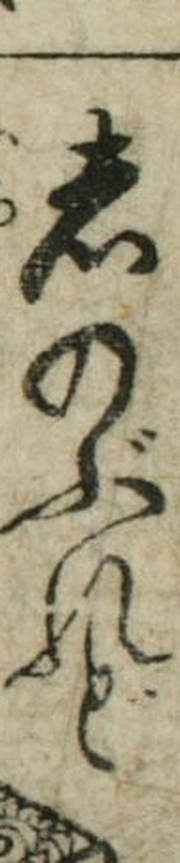しのぶれど
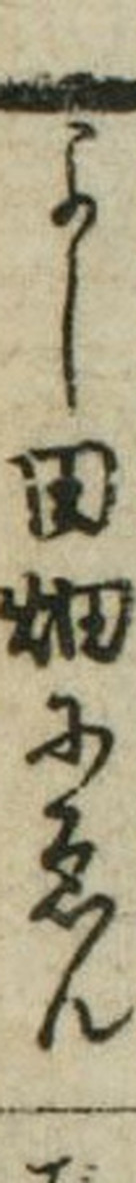よし田畑にゑん
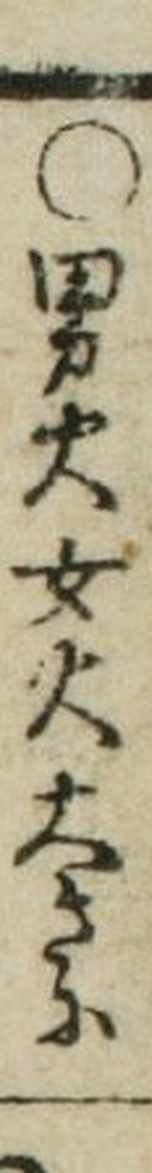○男火女火大きに
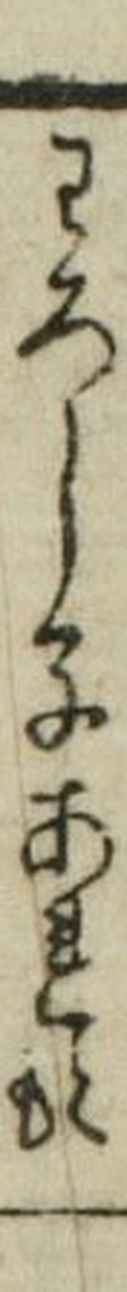わろし子あれとも
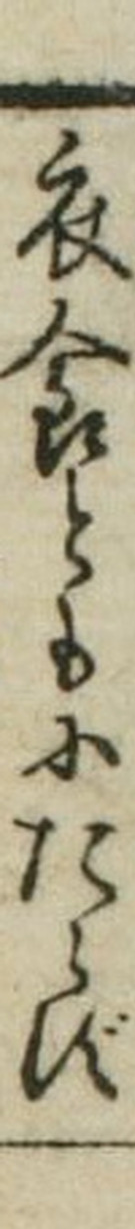衣食ともにたらず
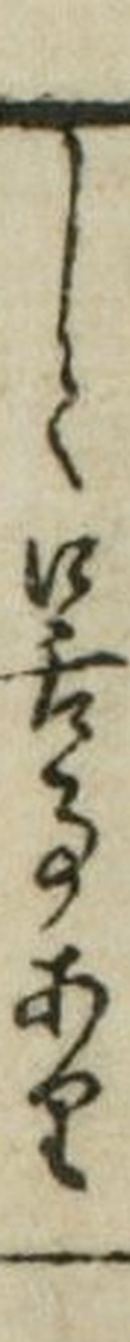して口舌事あり
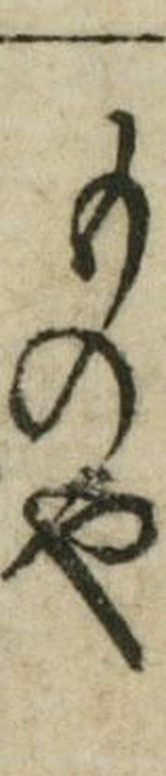ものや
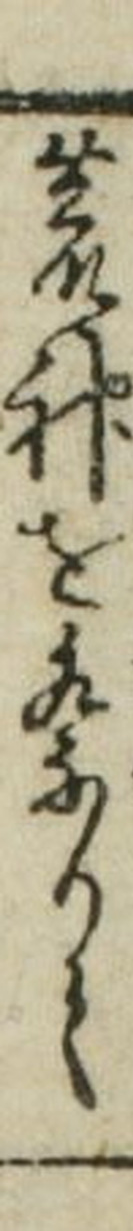荒神を祭りて
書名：百人一首
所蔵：東京学芸大学教育コンテンツアーカイブ
